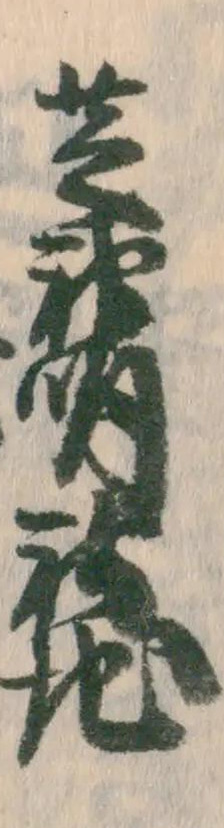芝神明神主
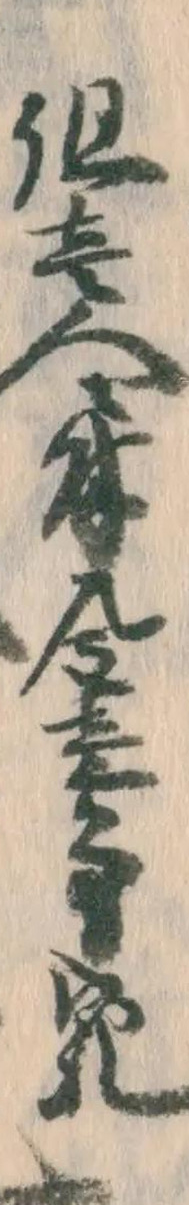但壱人ニ付金壱分宛九人
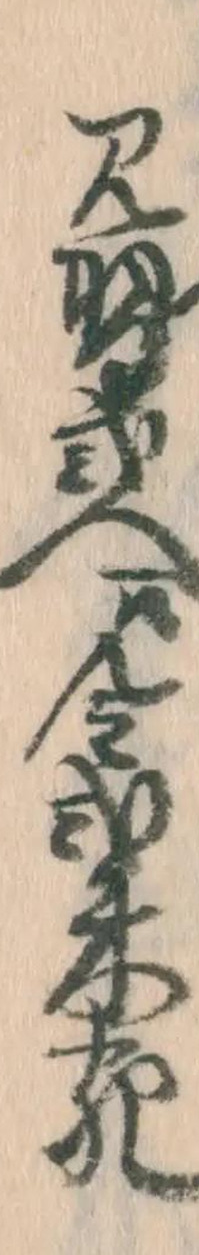見習弐人え金弐朱宛

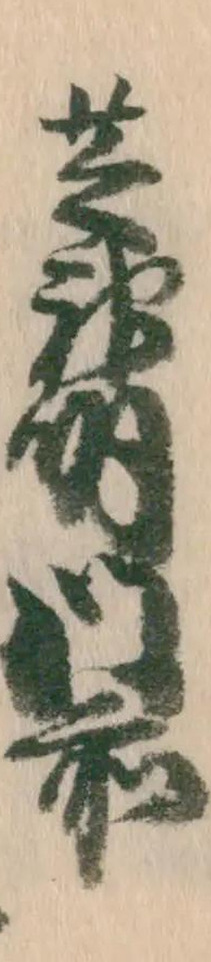同芝神明門前
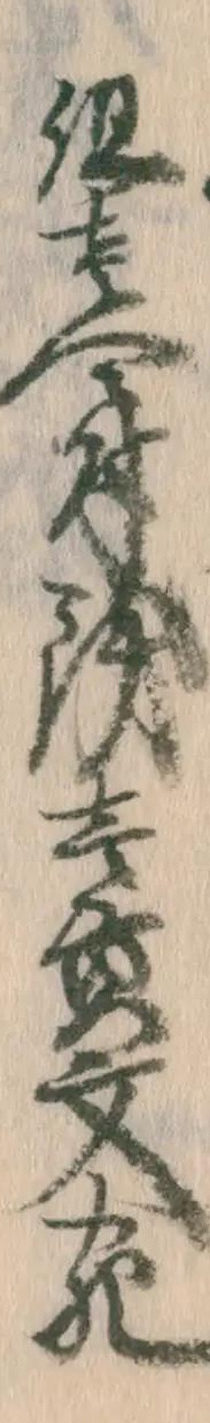但壱人ニ付銭壱貫文宛
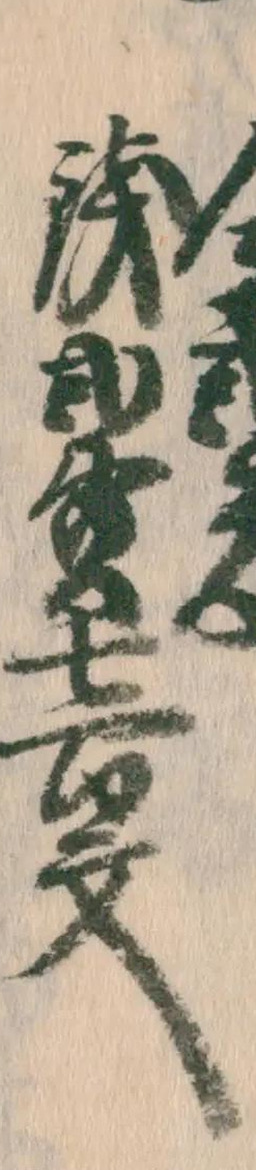銭拾貫七百文
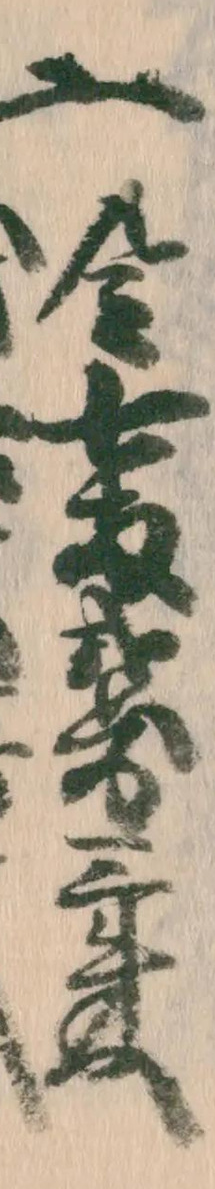〆金七両弐歩三朱
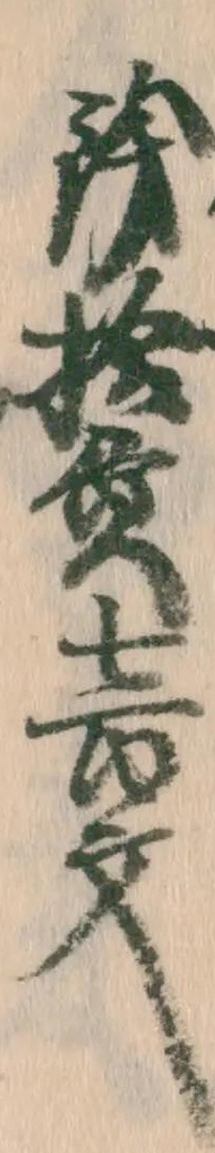銭拾貫七百文
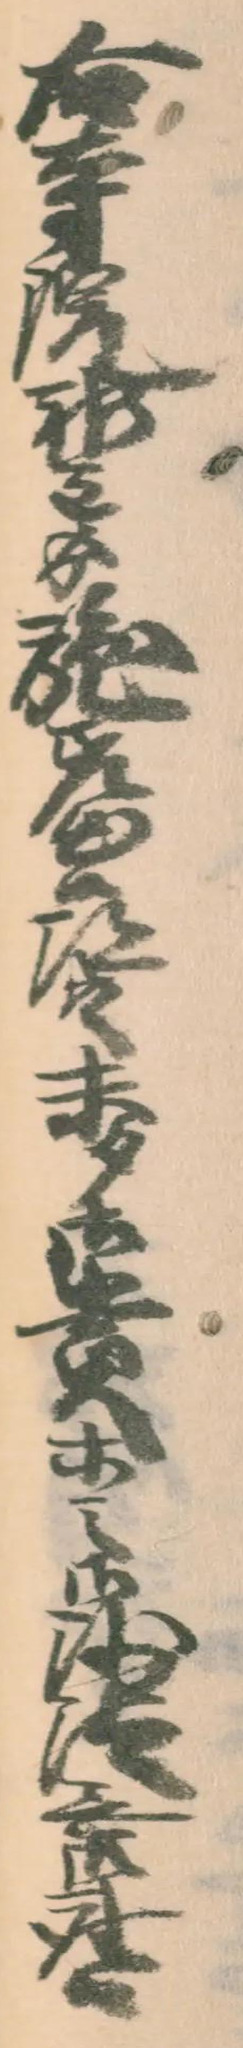右寺院神主ゟ施差出候得共未タ御賞等之御沙汰無御座候
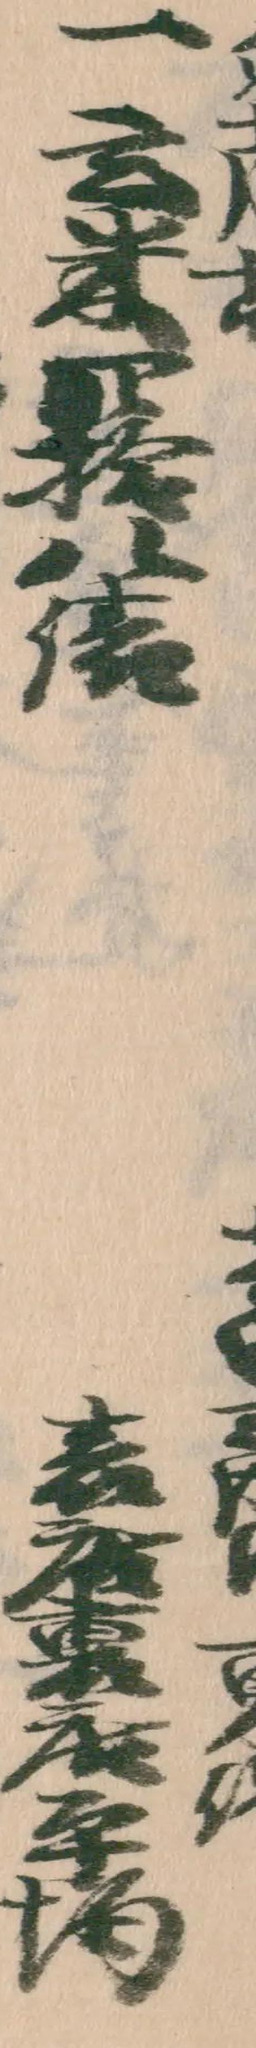一玄米百弐拾三俵表裏平均
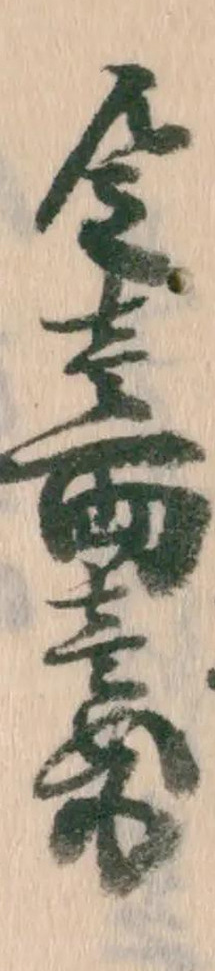金壱両壱歩
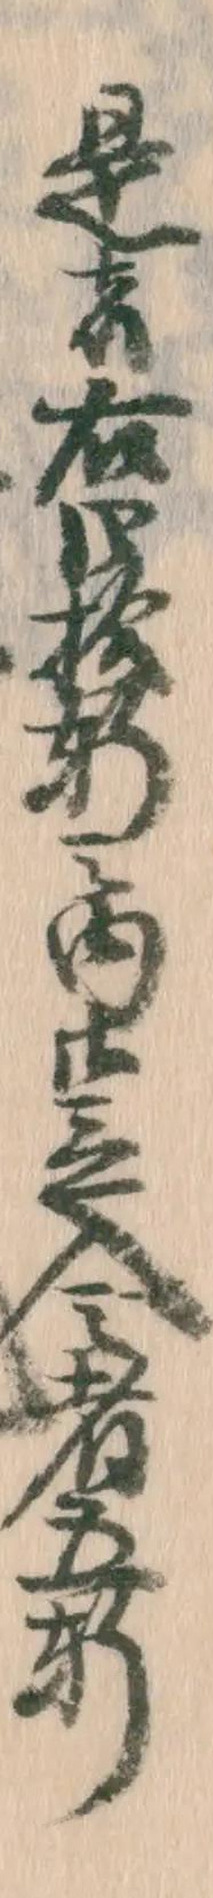是は右四拾軒之内御立入之者五軒
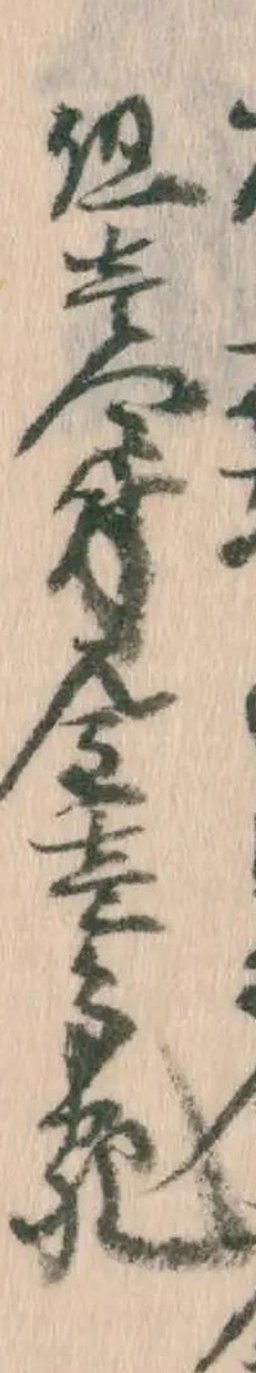但壱人ニ付金壱分宛
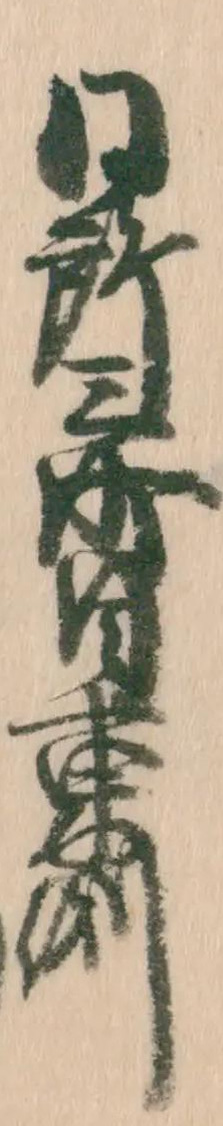同同所三丁目東側
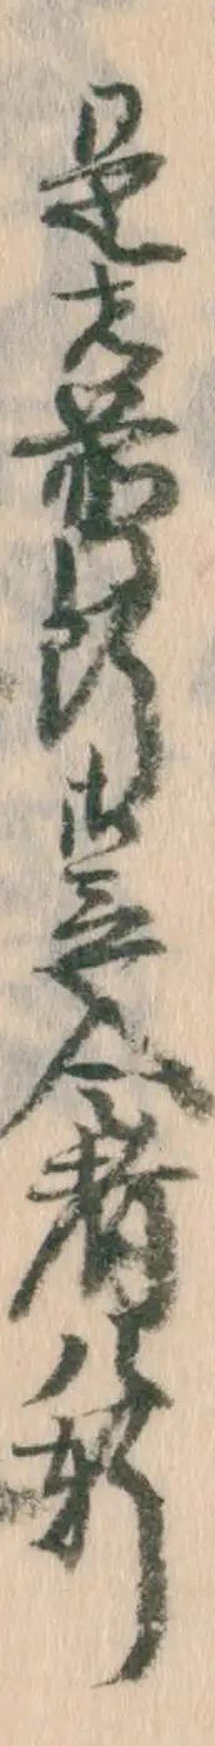是は前同断御立入之者八軒
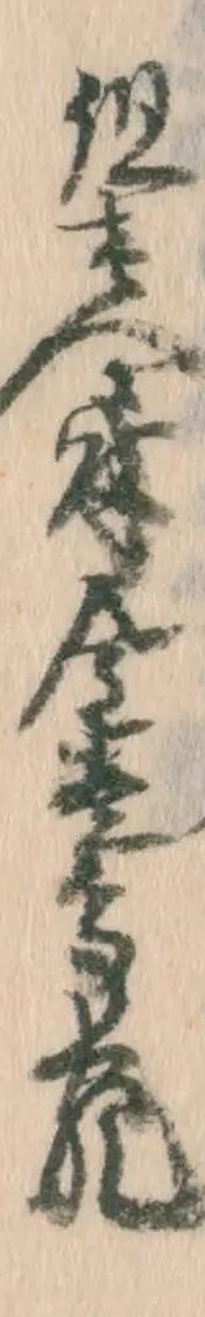但壱人ニ付金壱分宛
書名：武家方并寺院等ニテ施差出候一件
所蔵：国立国会図書館 National Diet Library, JAPAN
